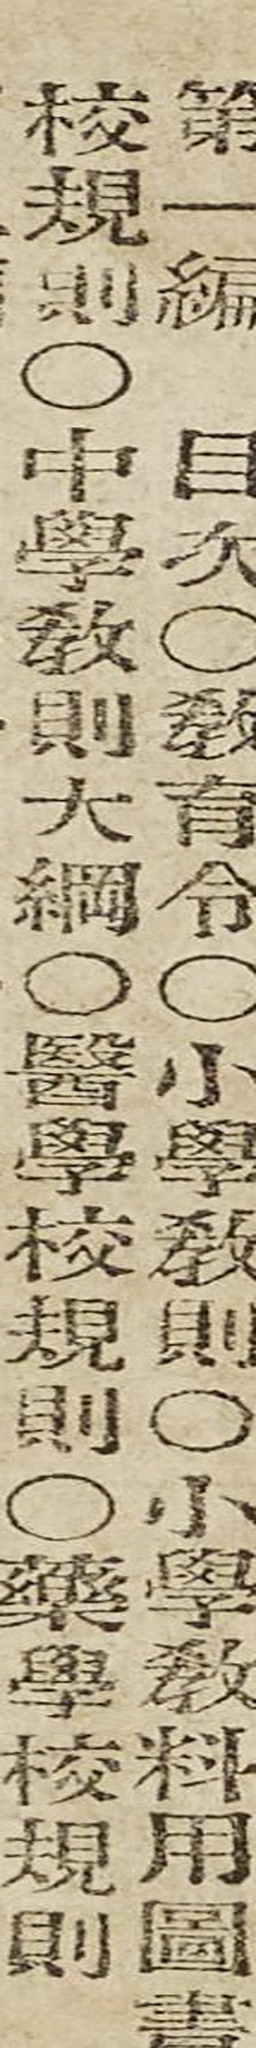校規則○中学教則大綱○医学校規則○薬学校規則
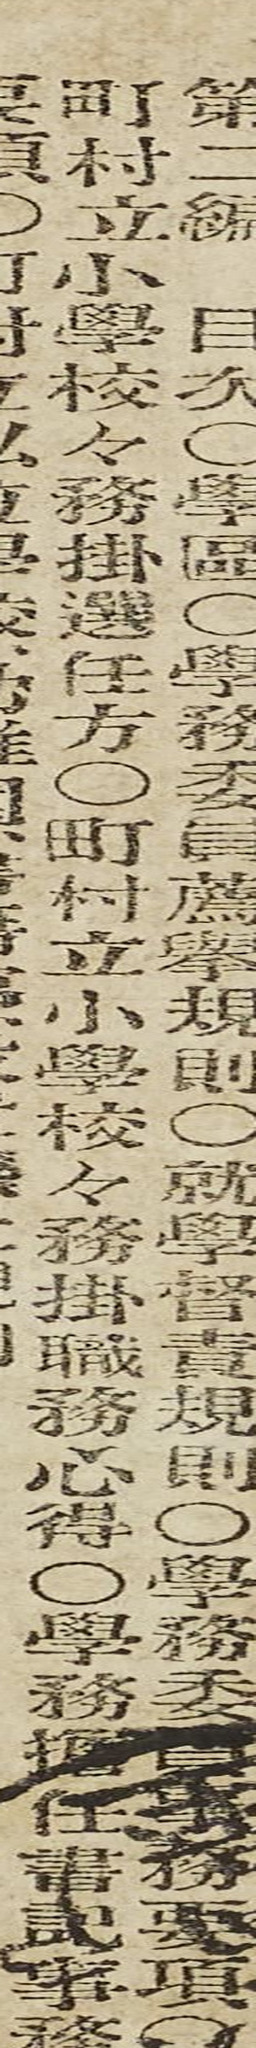町村立小学校々務掛選任方○町村立小学校々務掛職務心得○学務担任書記事務
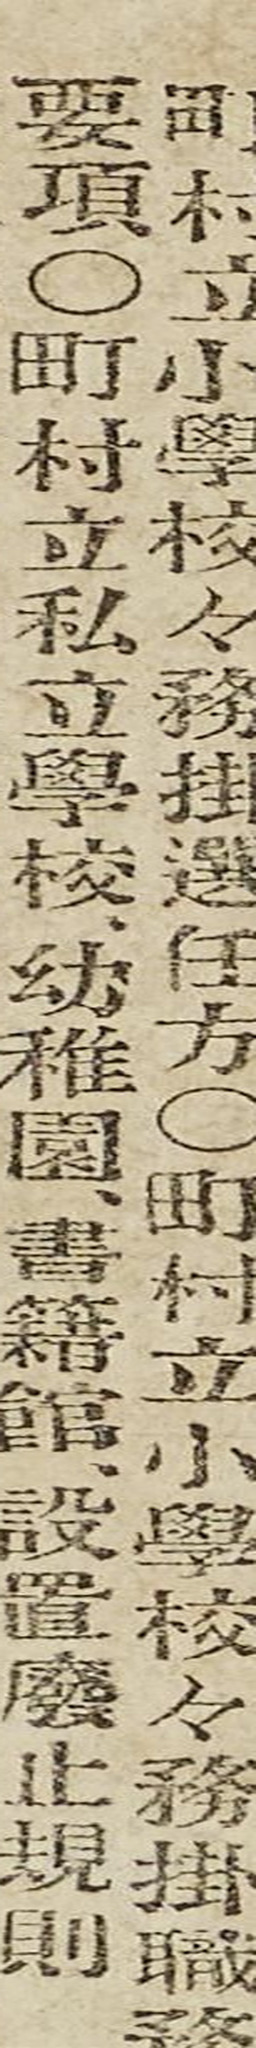要項○町村立私立学校、幼稚園、書籍館、設置廃止規則
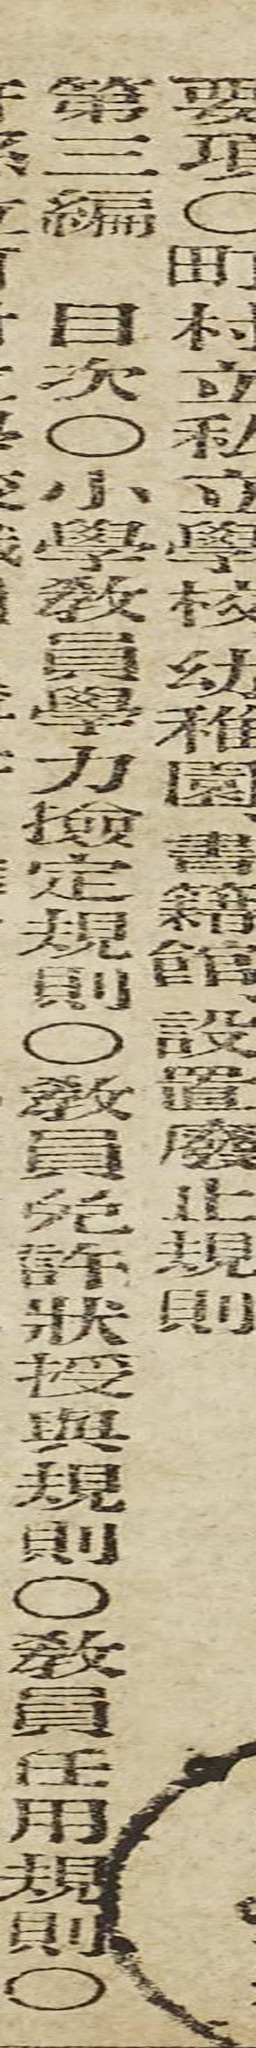第三編目次○小学校教員学力検定規則○教員免許状授与規則○教員任用規則○
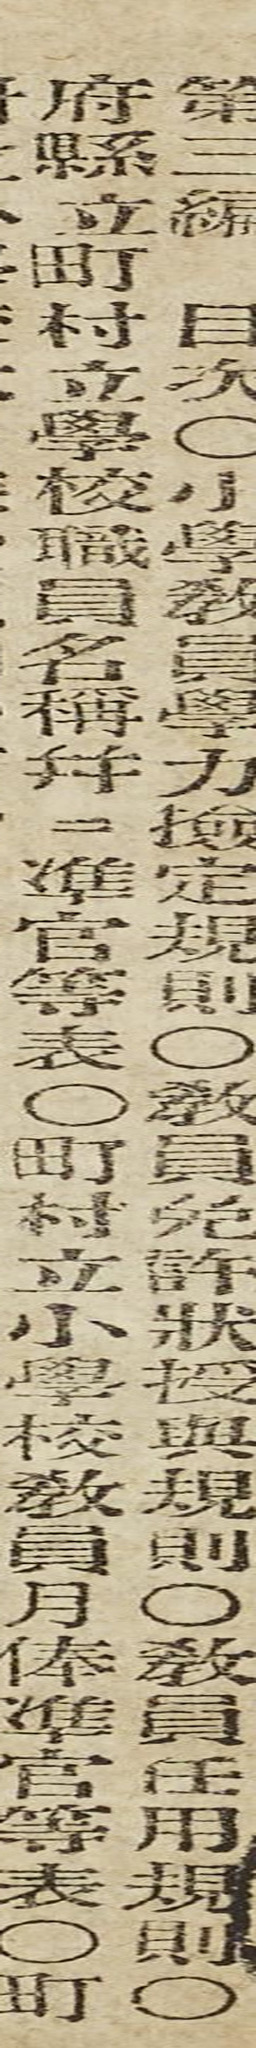府県立町村立学校職員名称幷ニ準官等表○町村立小学校教員月俸準官等表○町
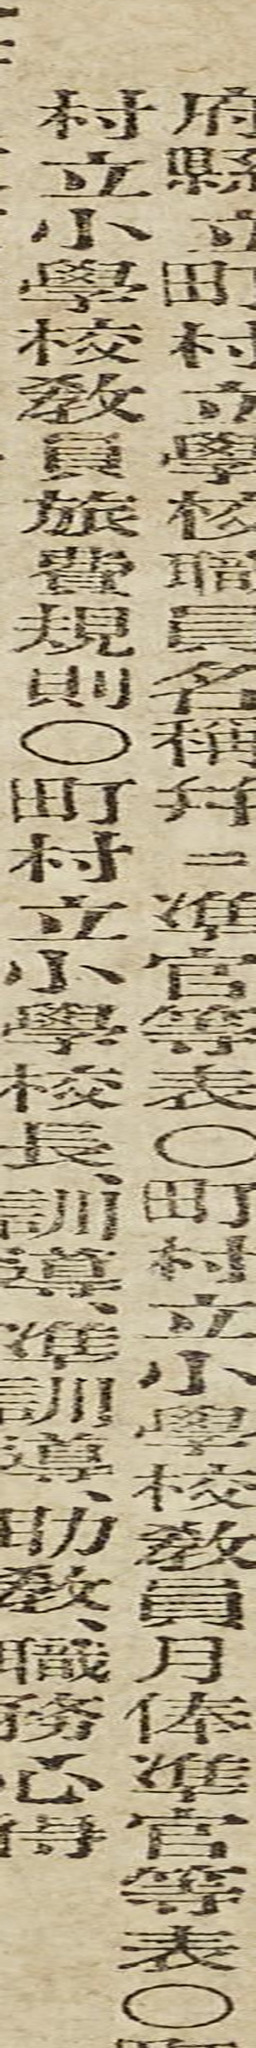村立小学校教員旅費規則○町村立小学校長、訓導、準訓導、助教、職務心得
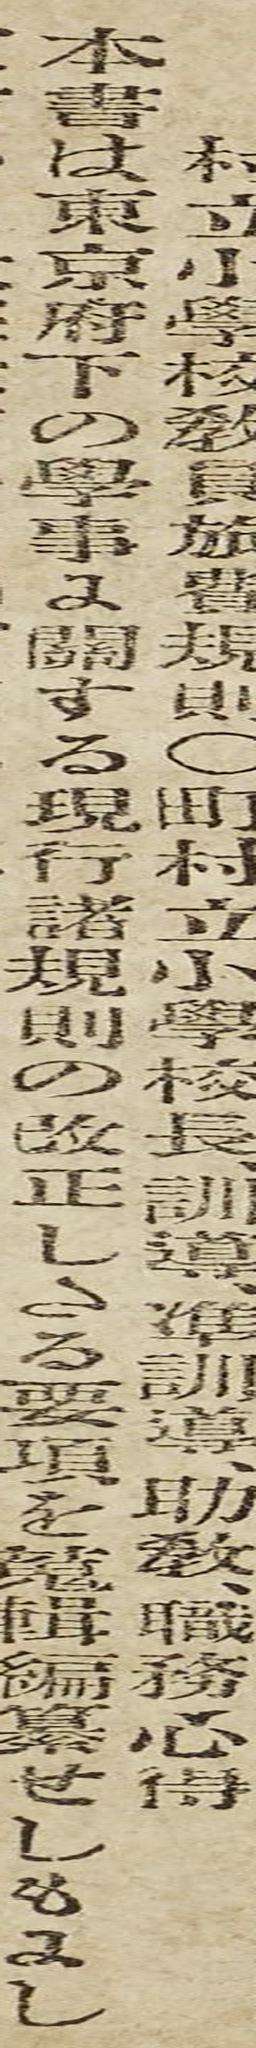本書は東京府下の学事に関する現行諸規則の改正したる要項を蒐輯編纂せしもにし
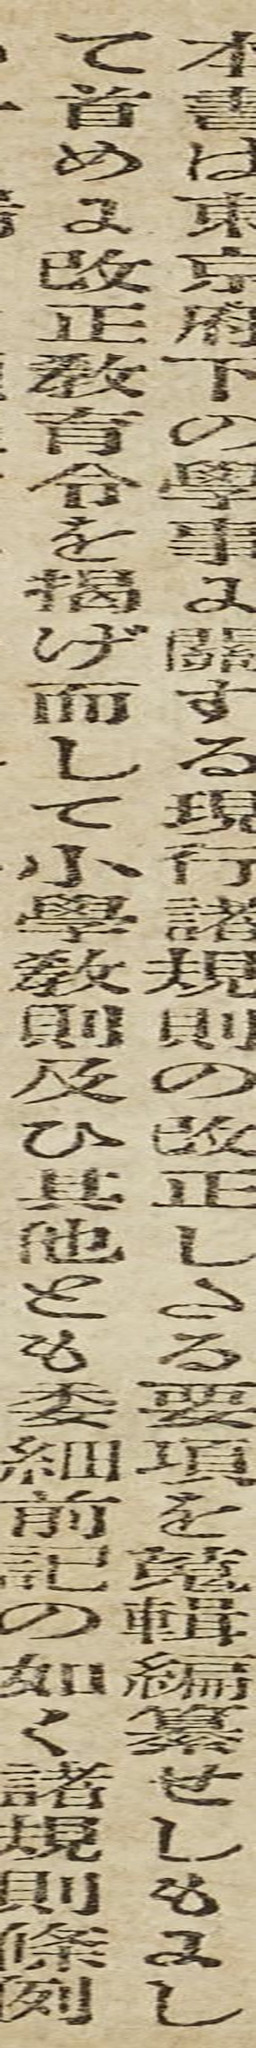て首めに改正教育令を掲げ而して小学教則及ひ其他とも委細前記の如く諸規則條例
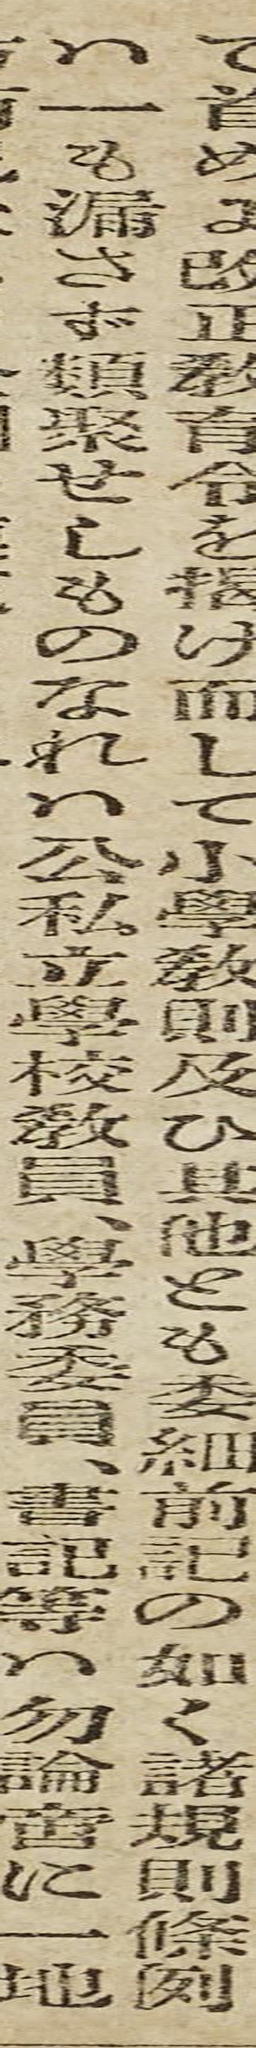は一も漏さず類聚せしものなれは公私立学校教員、学務委員、書記等は勿論啻に一地
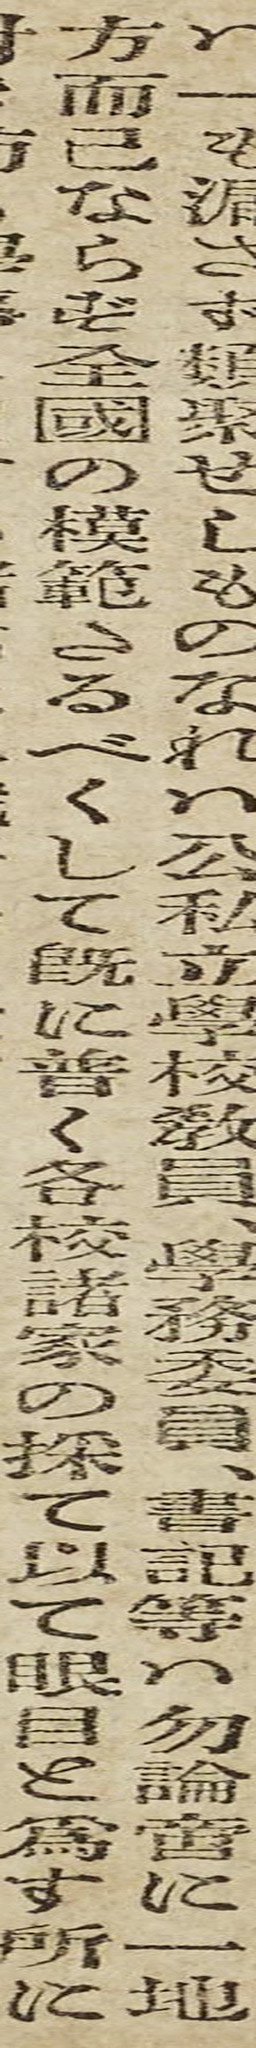方而已ならず全国の模範たるべくして既に普く各校諸家の採て以て眼目と為す所に
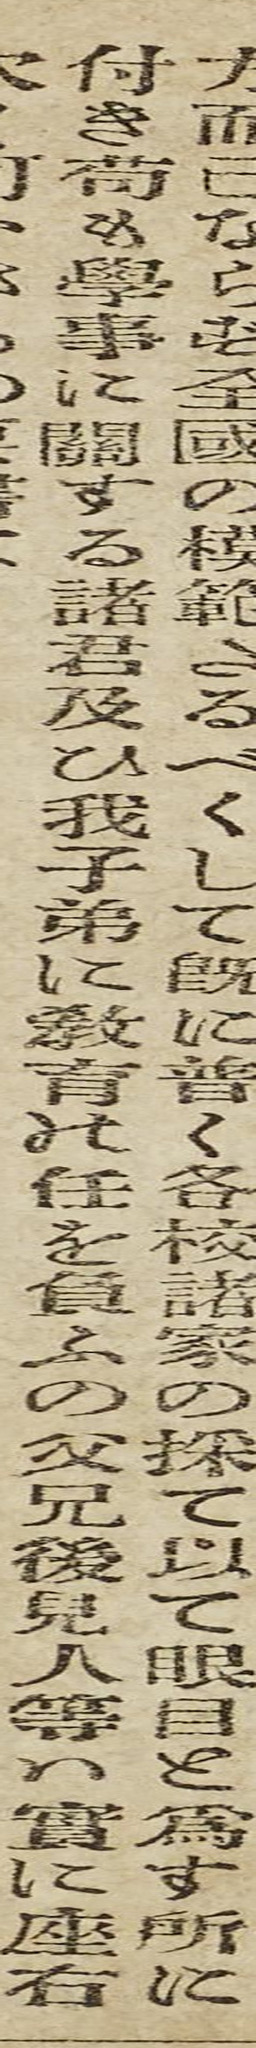付き苟も学事に関する諸君及ひ我子弟に教育の任を負ふの父兄後見人等は実に座右
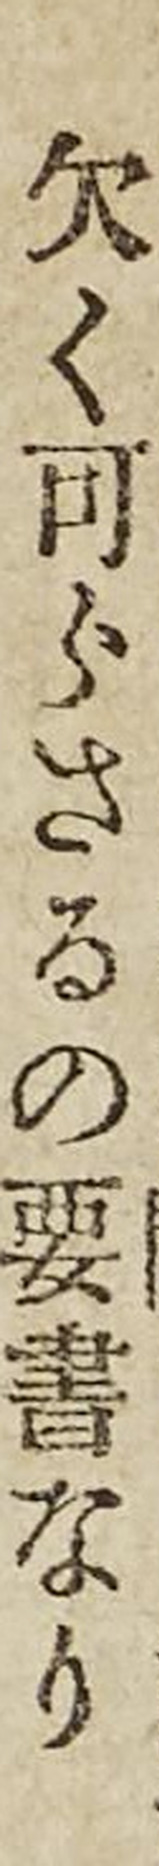欠く可らさるの要書なり
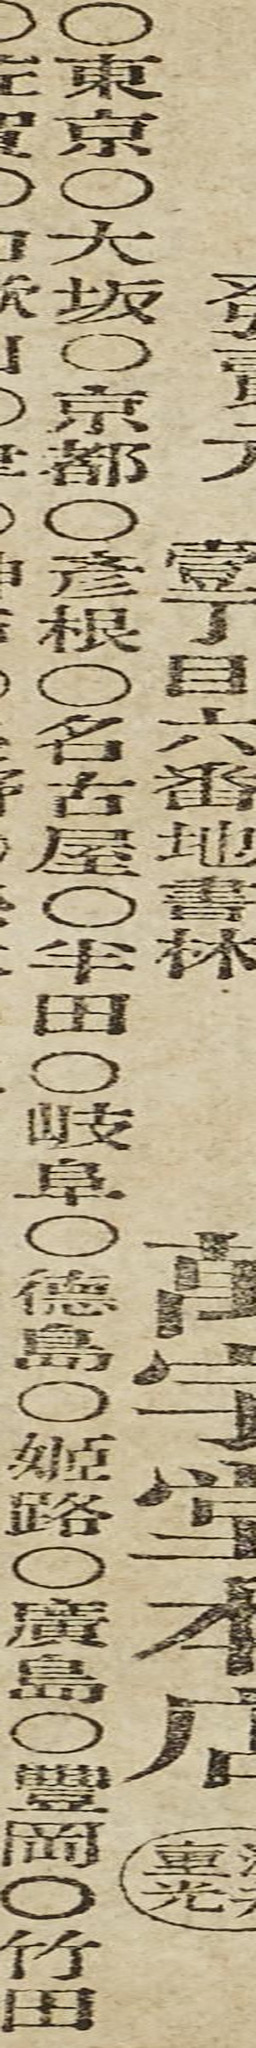○東京○大坂○京都○彦根○名古屋○半田○岐阜○徳島○姫路○広島○豊岡○竹田
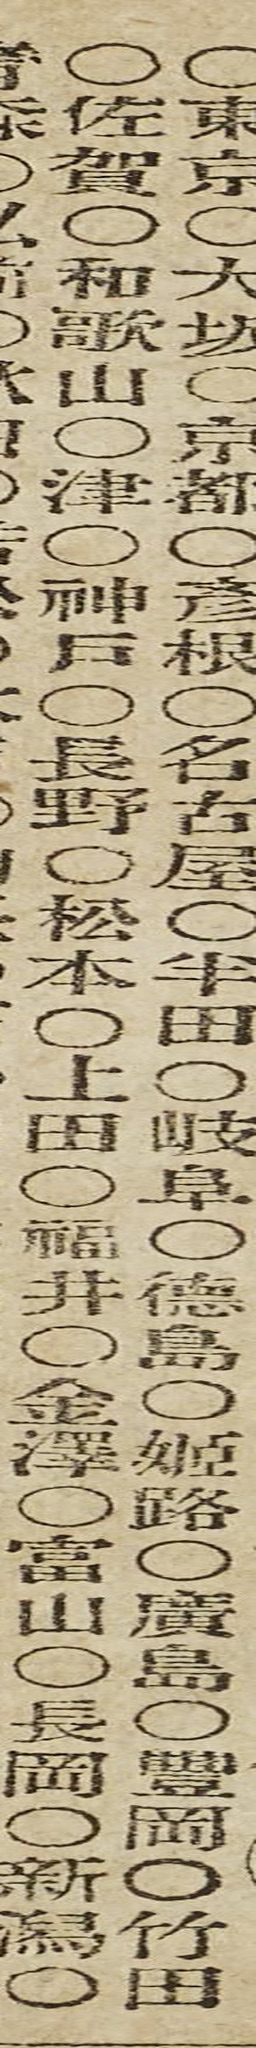○佐賀○和歌山○津○神戸○長野○松本○上田○福井○金沢○富山○長岡○新潟○
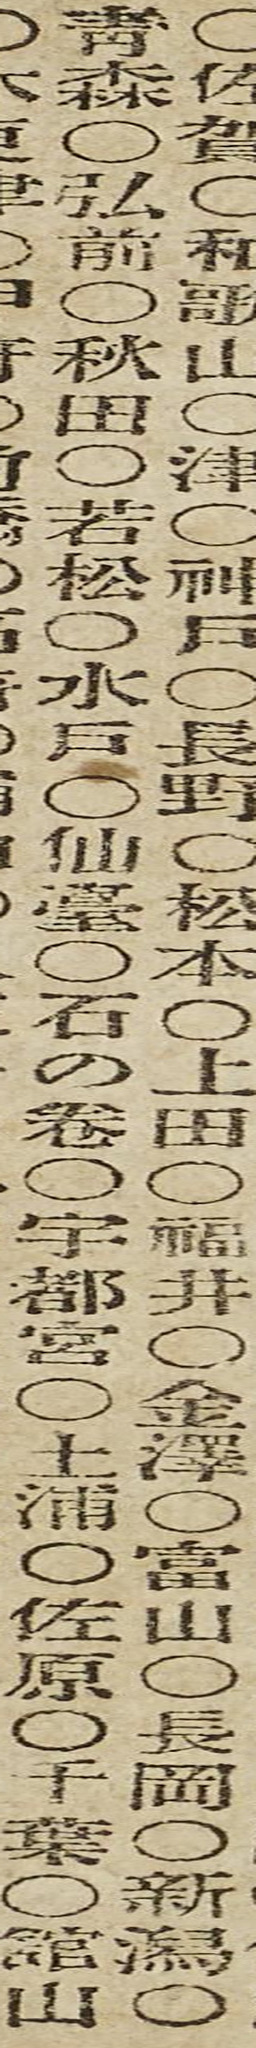青森○弘前○秋田○若松○水戸○仙台○石の巻○宇都宮○土浦○佐原○千葉○館山
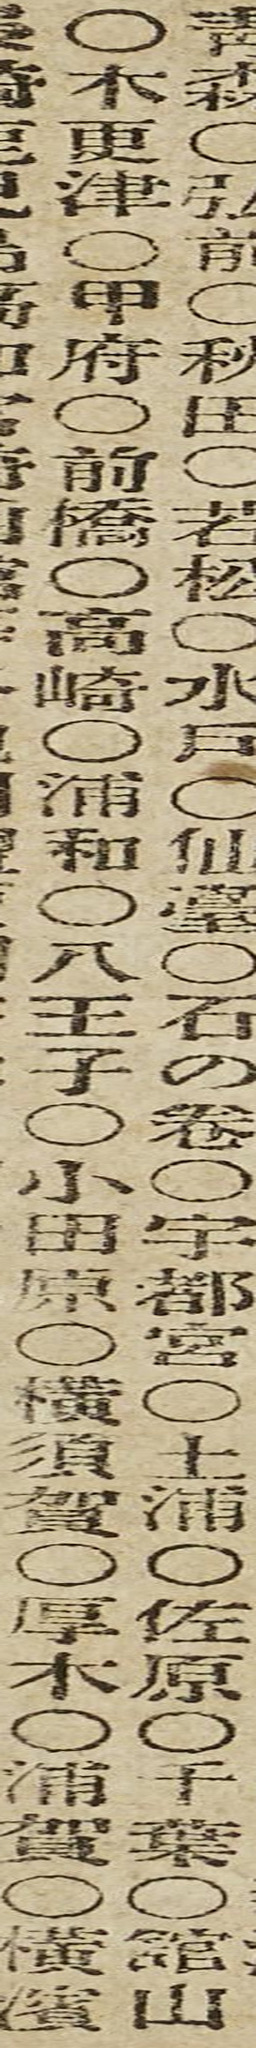○木更津○甲府○前橋○高崎○浦和○八王子○小田原○横須賀○厚木○浦賀○横浜
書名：永代惨話　文化の夢　全
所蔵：東京大学地震研究所図書室 Earthquake Research Institute Library, The University of Tokyo, JAPAN
